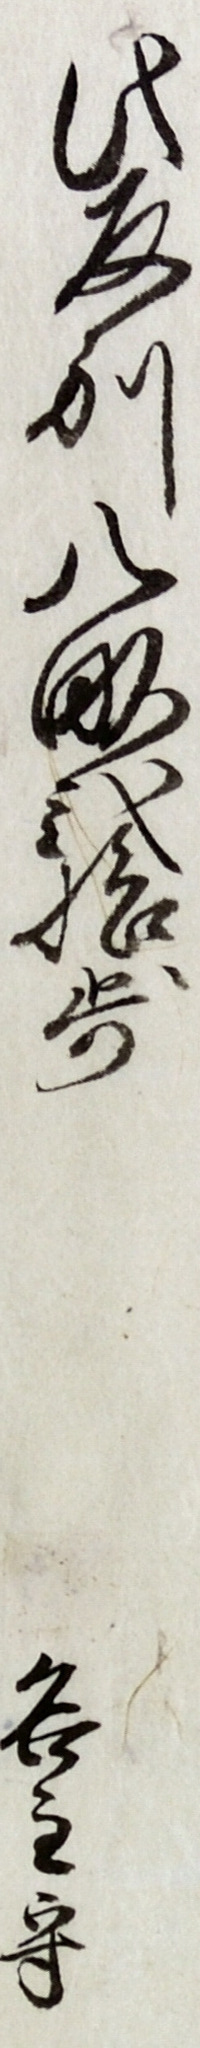此反別八畝弐拾歩名主守

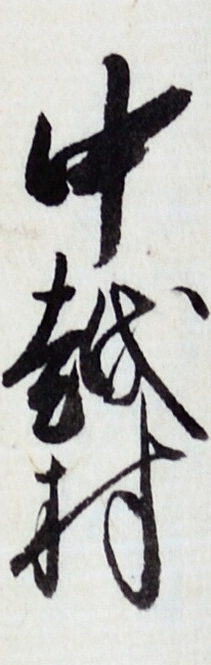中越村
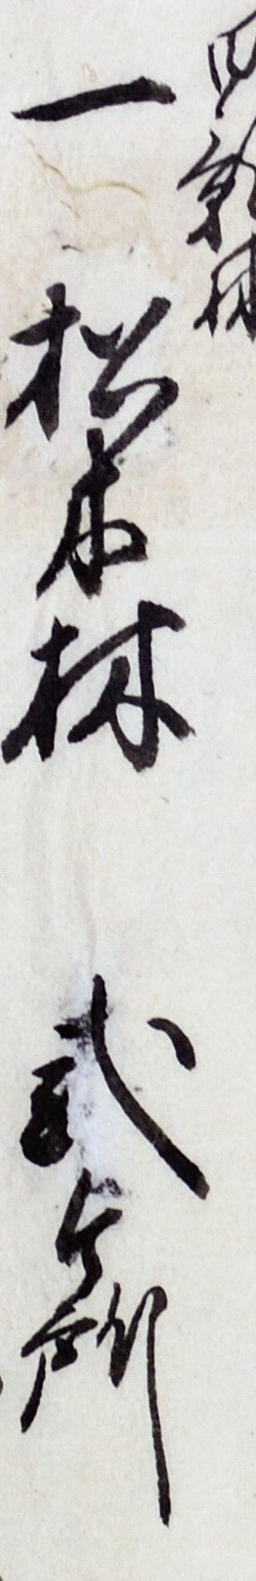一松木林弐ケ所
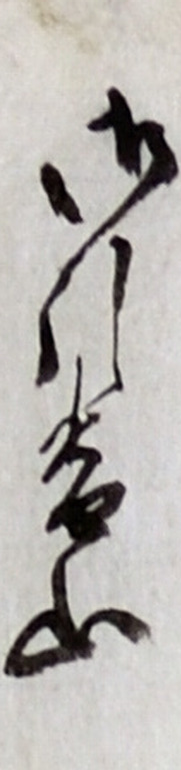御引替山

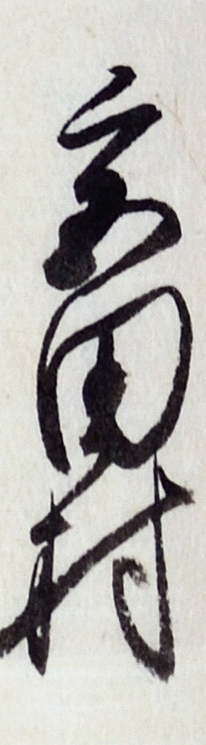宮田村
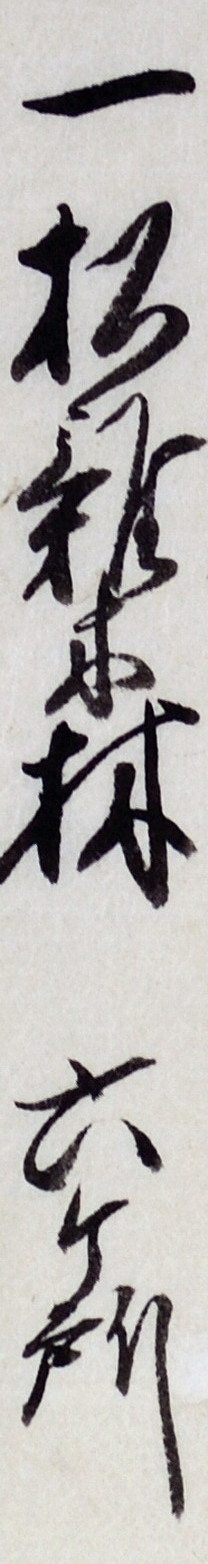一松雑木林六ケ所
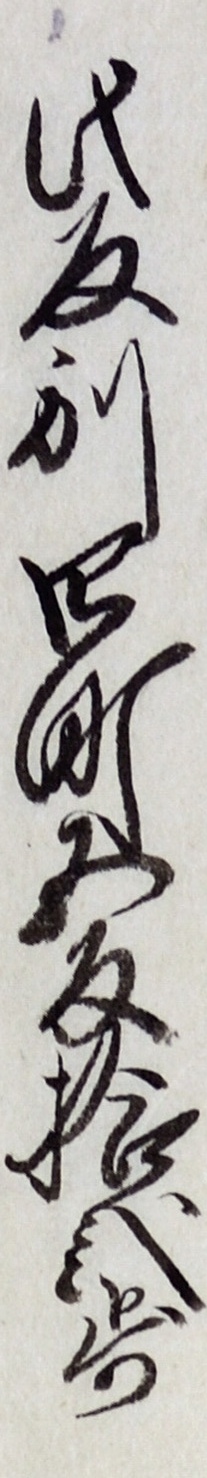此反別四町五反拾八歩
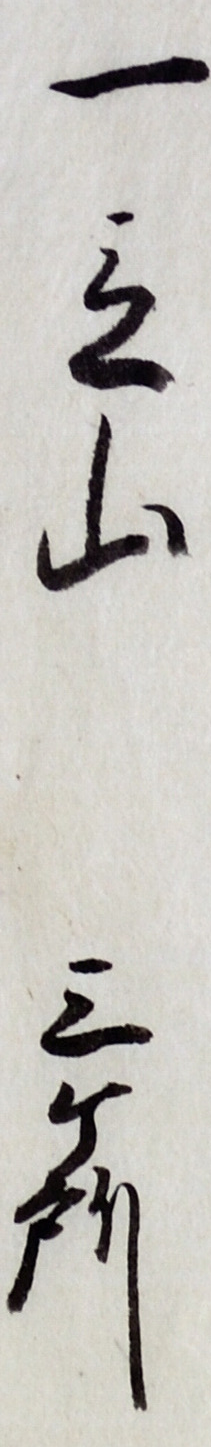一立山三ケ所

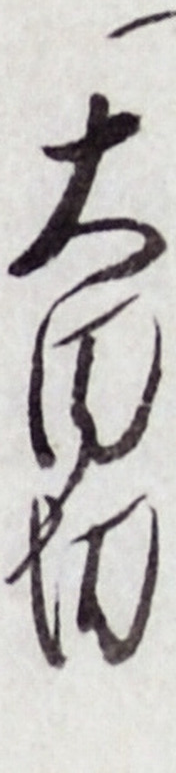大田切
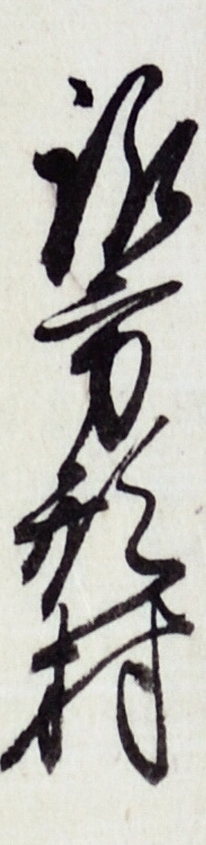諏訪形村
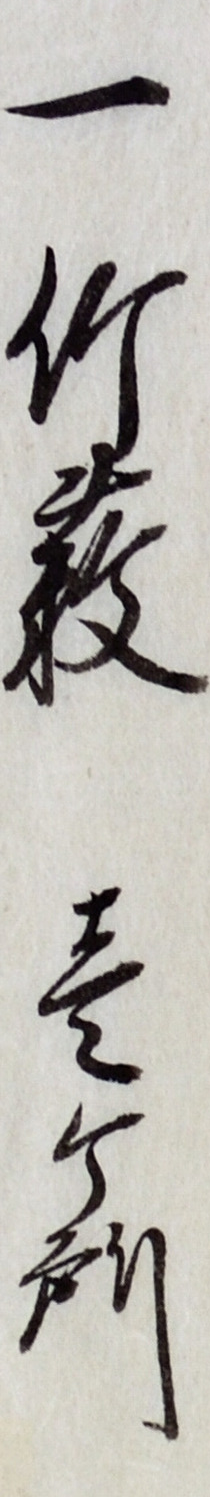一竹藪壱ケ所

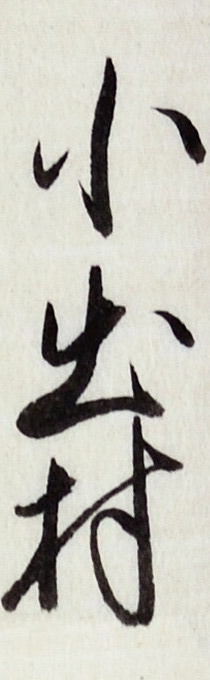小出村
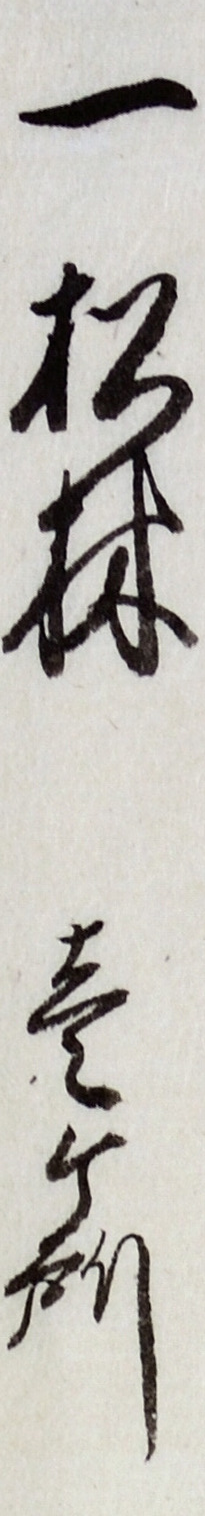一松林壱ケ所
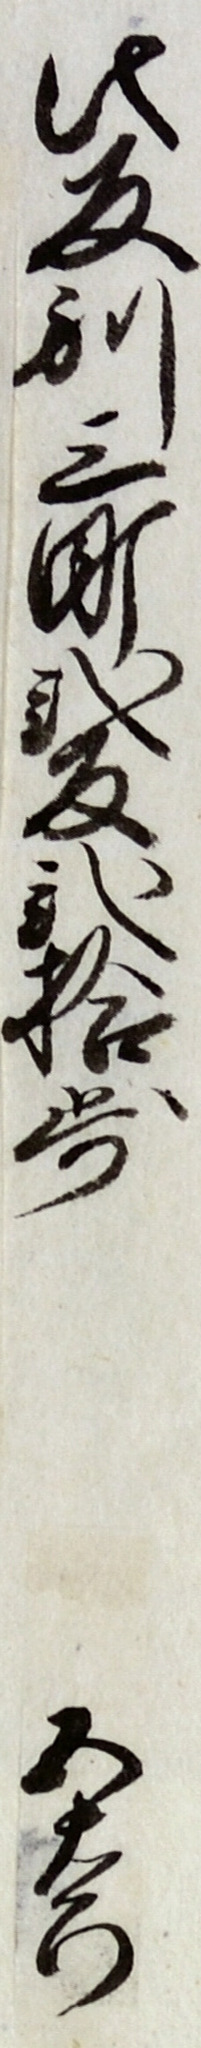此反別三町弐反弐拾歩五右衛門
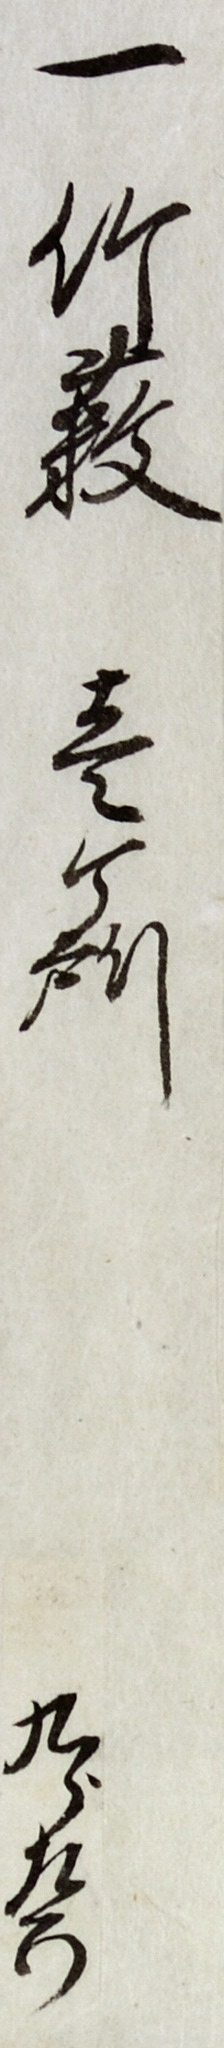一竹藪壱ケ所九郎左衛門

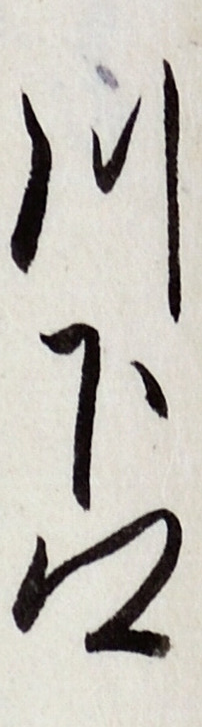川下郷
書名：御領分中御林御藪附帳
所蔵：伊那市立高遠町図書館・合同会社AMANE
